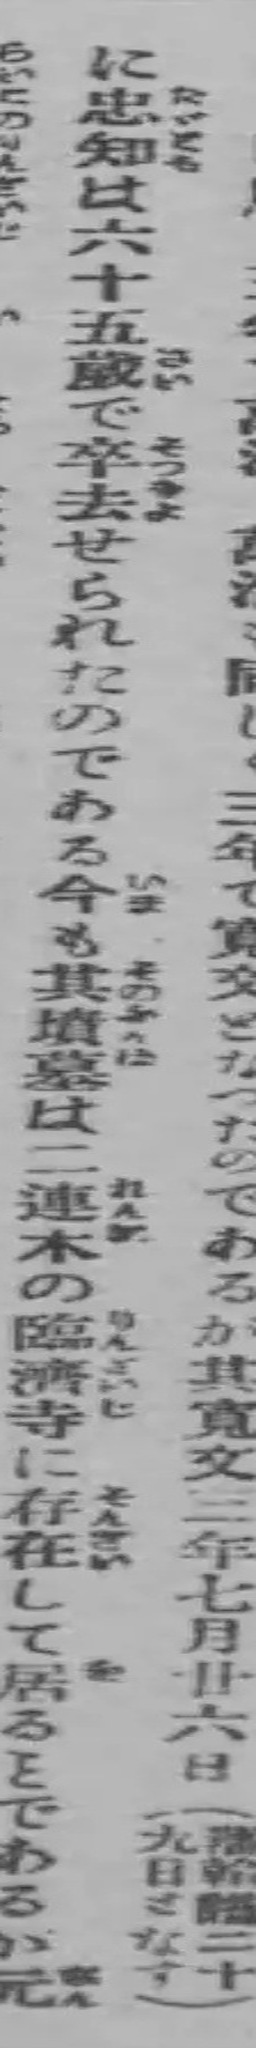忠知の卒去に忠知は六十五歳で卒去せられたのである今も其墳墓は二連木の臨済寺に存在して居ることであるが元
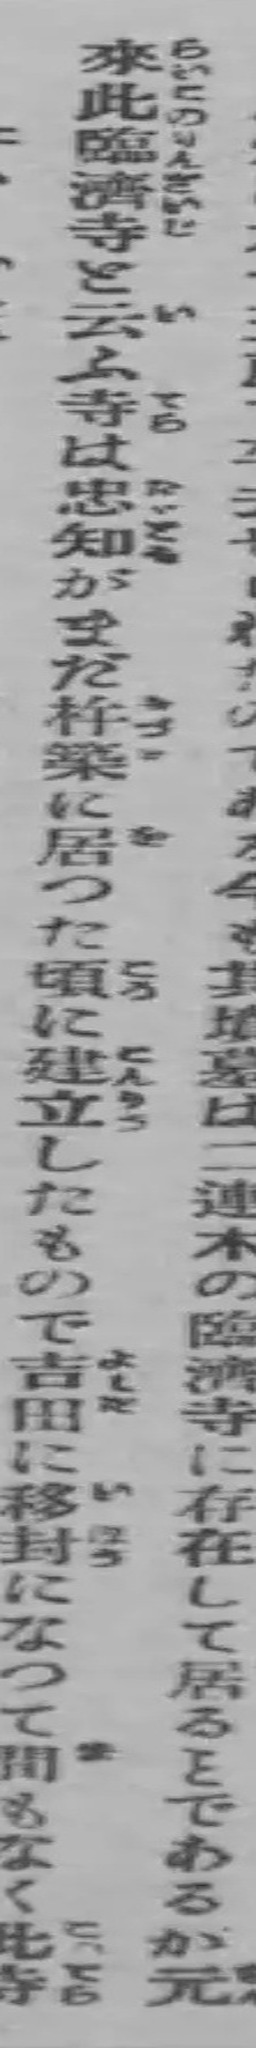臨済寺来此臨済寺と云ふ寺は忠知がまだ杵築に居つた頃に建立したもので吉田に移封になつて間もなく此寺
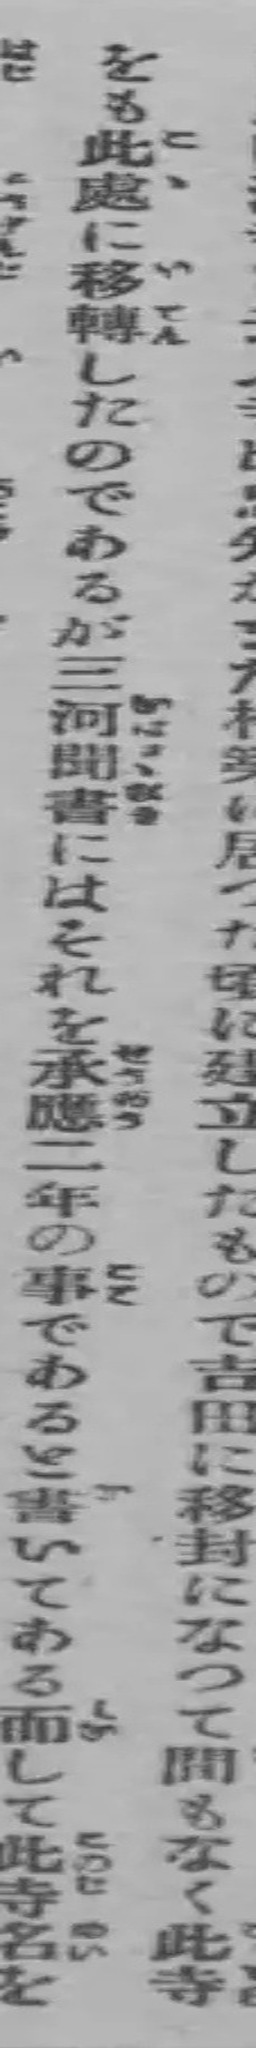をも此処に移転したのであるが三河聞書にはそれを承応二年の事であると書いてある而して此寺名を
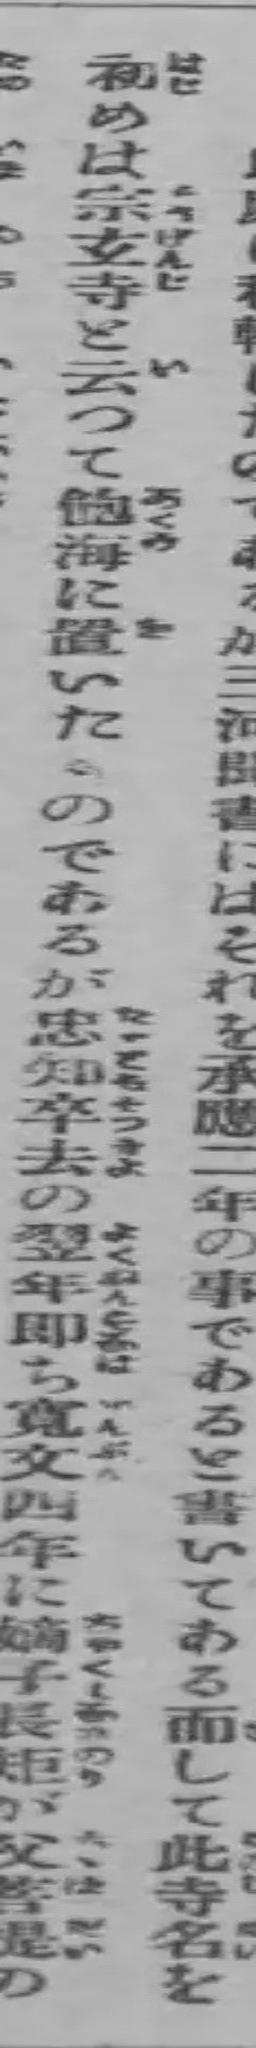初めは宗玄寺と云つて飽海に置いたものであるが忠知卒去の翌年即ち寛文四年に嫡子長矩が父菩提の
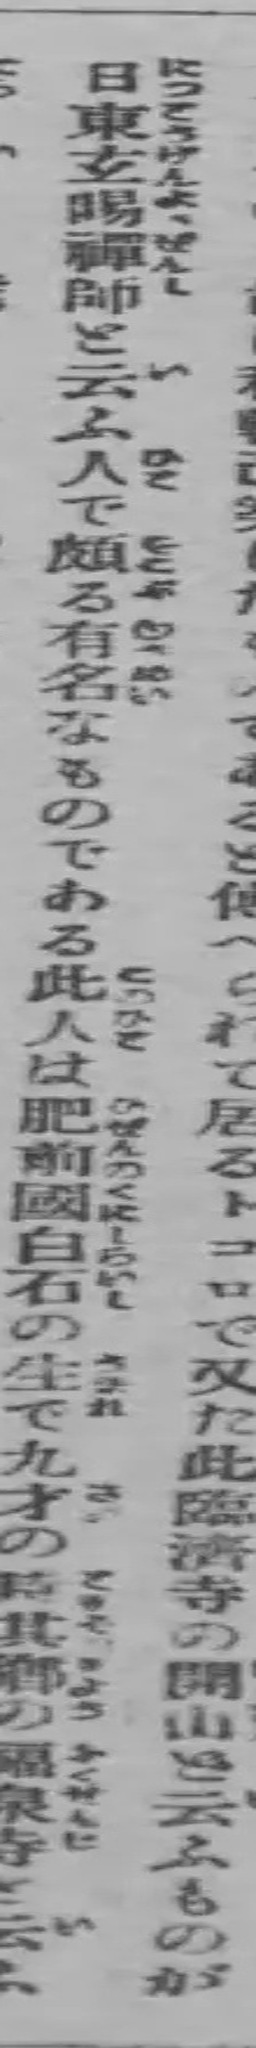日東玄陽禅師と云ふ人で頗る有名なものである此人は肥前国白石の生で九才の時其郷の福泉寺と云ふ
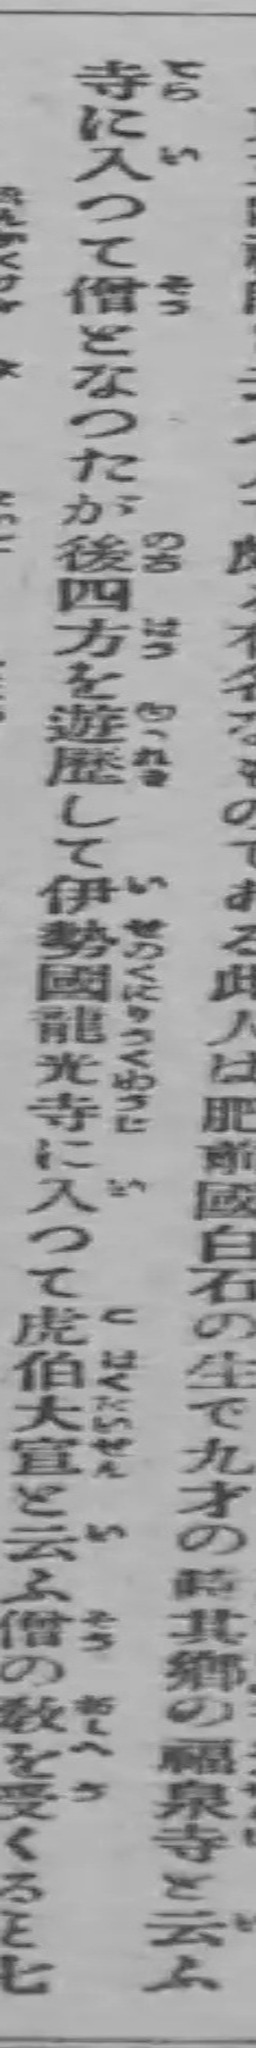寺に入つて僧となつたが後四方を遊歴して伊勢国龍光寺に入つて虎伯大宣と云ふ僧の教を受くること七
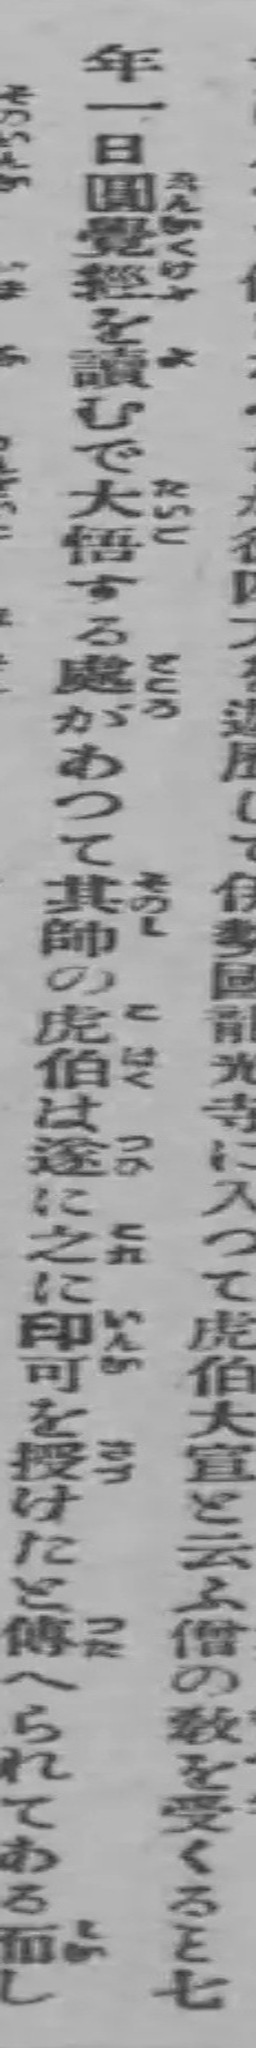年一日円覚経を読むで大悟する処があつて其師の虎伯は遂に之に印可を授けたと伝へられてある而し
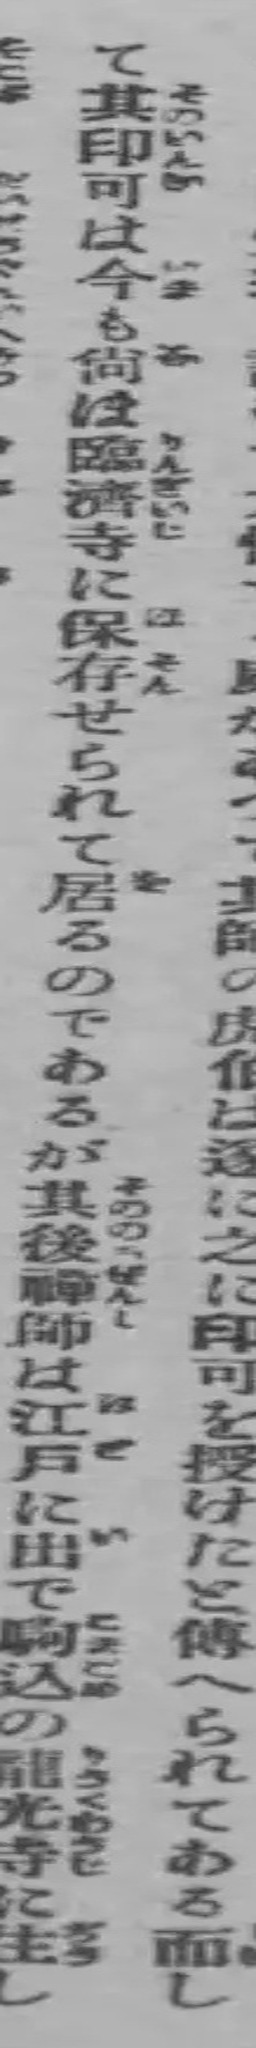て其印可は今も尚ほ臨済寺に保存せられて居るのであるが其後禅師は江戸に出で駒込の龍光寺に住し
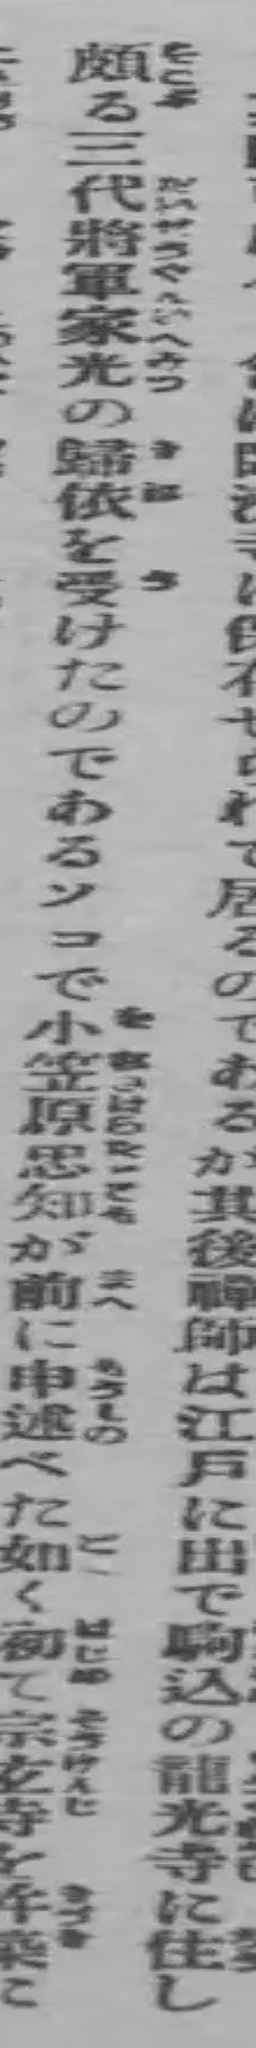頗る三代将軍家光の帰依を受けたのであるソコで小笠原忠知が前に申述べた如く初て宗玄寺を杵築に
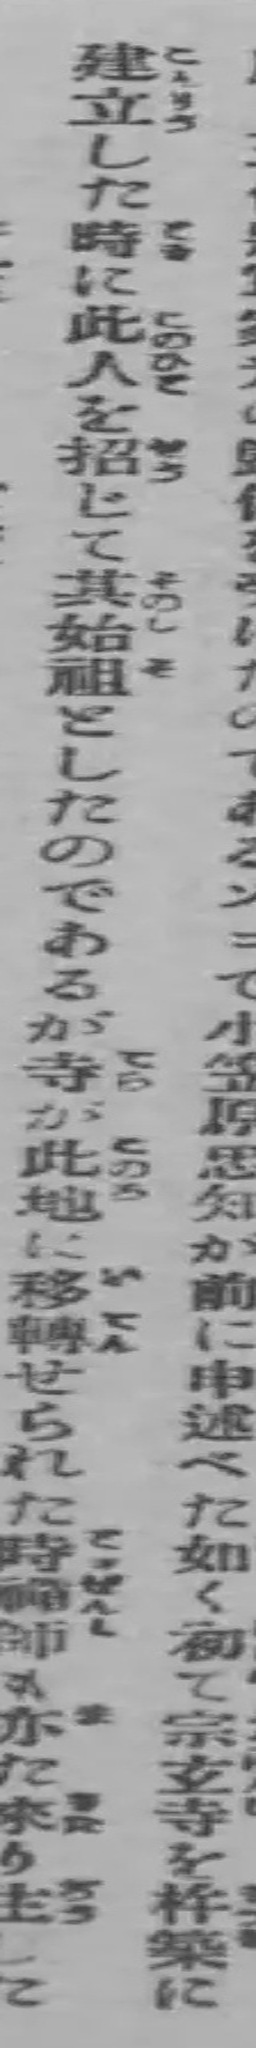建立した時に此人を招じて其始祖としたのであるが寺が此地に移転せられた時禅師も亦た来り住した
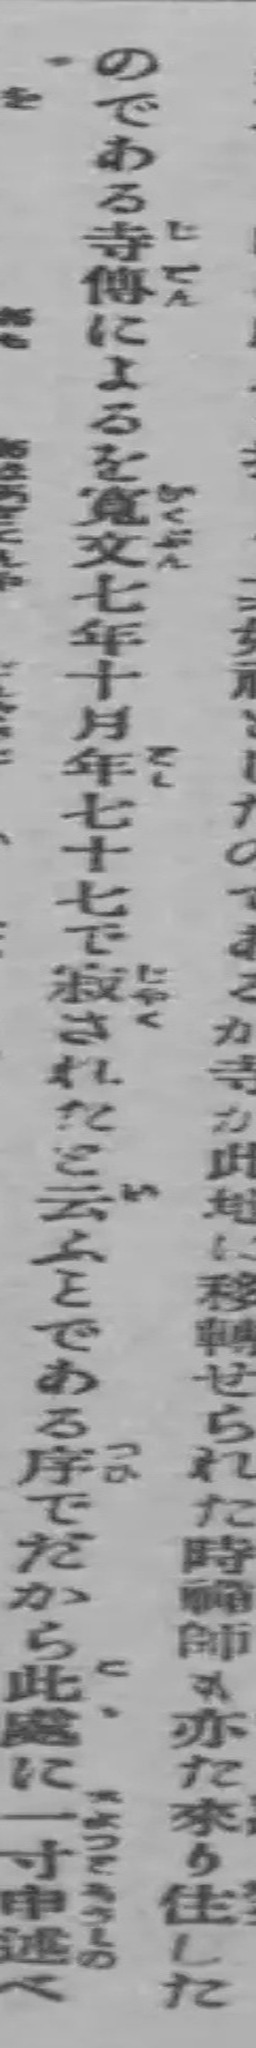のである寺伝によるを寛文七年十月年七十七で寂されたと云ふことである序でだから此処に一寸申述べ
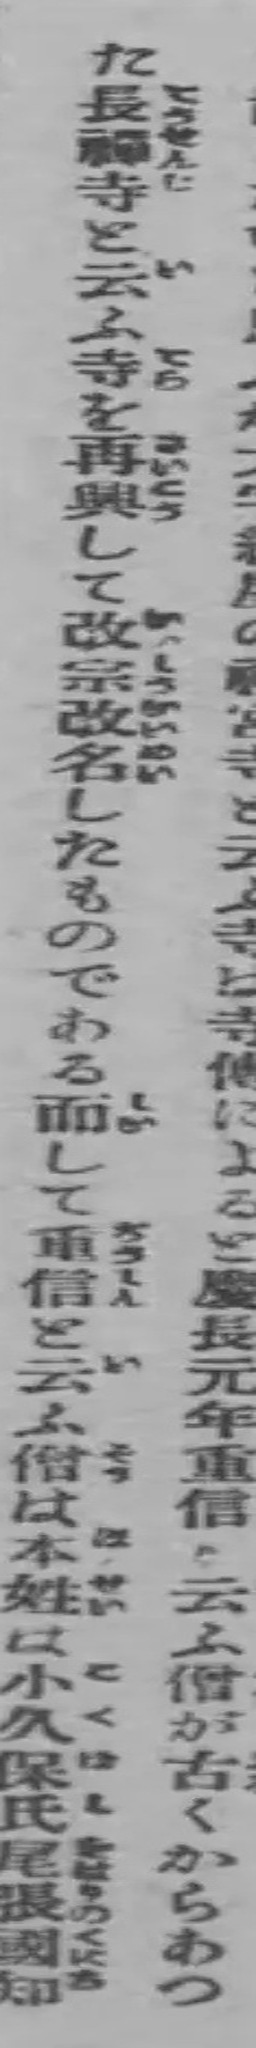た長禅寺と云ふ寺を再興して改宗改名したものである而して重信と云ふ僧は本姓は小久保氏尾張国知
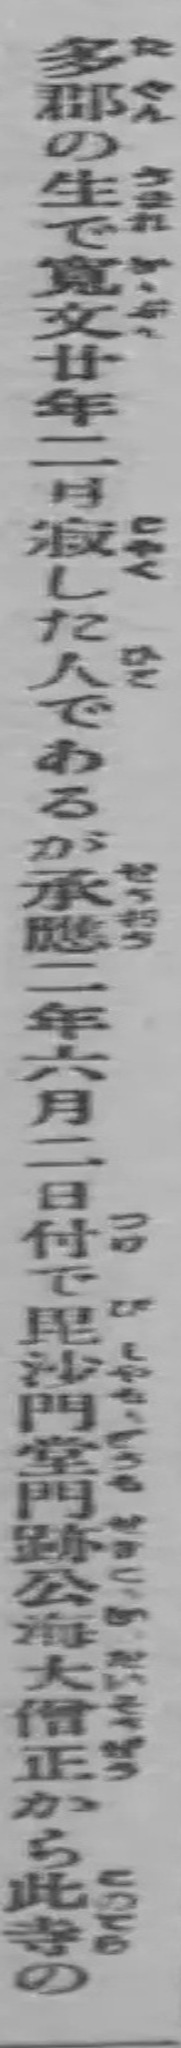多郡の生で寛文廿年二月寂した人であるが承応二年六月二日付で毘沙門堂門跡公海大僧正から此寺の
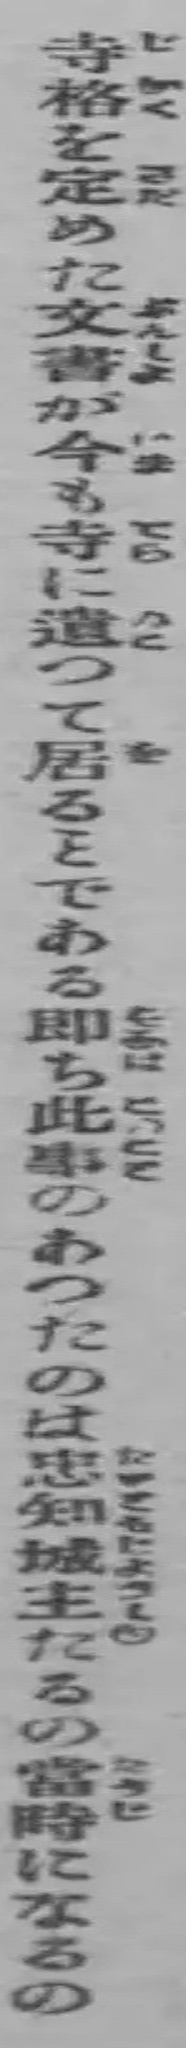寺格を定めた文書が今も寺に遺つて居ることである即ち此事のあつたのは忠知城主たるの当時になるの
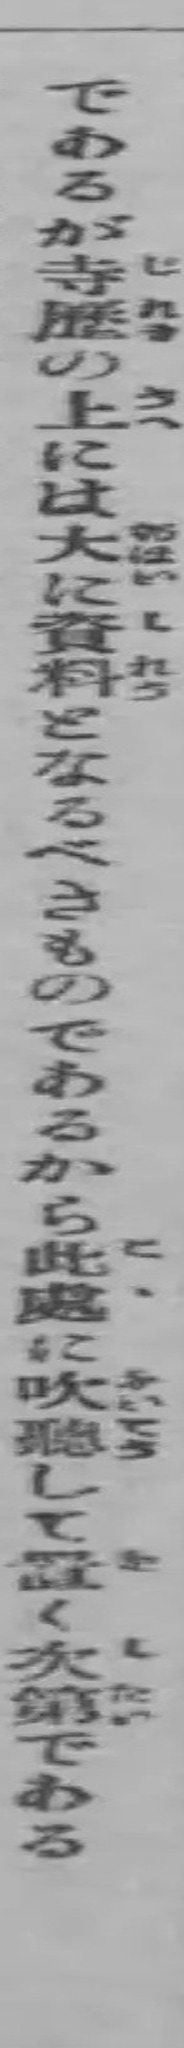であるが寺歴の上には大に資料となるべきものであるから此処に吹聴して置く次第である
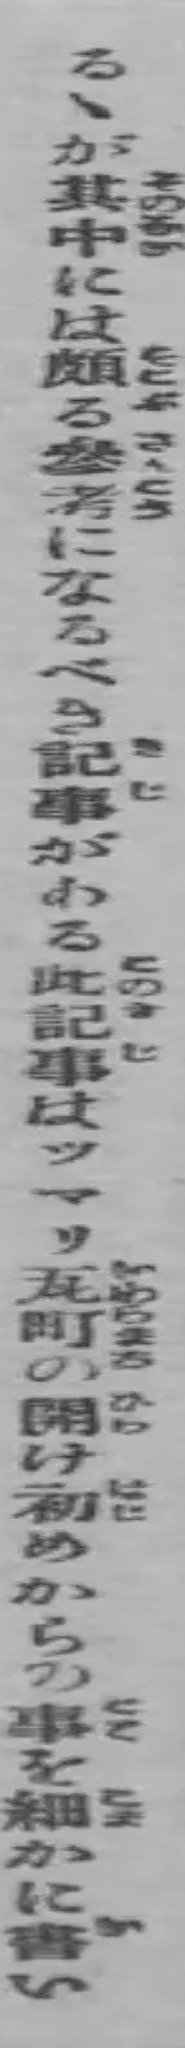るゝが其中には頗る参考になるべき記事がある此記事はツマリ瓦町の開け初めからの事を細かに書い
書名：豊橋市史談
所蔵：国立国会図書館 National Diet Library, JAPAN
